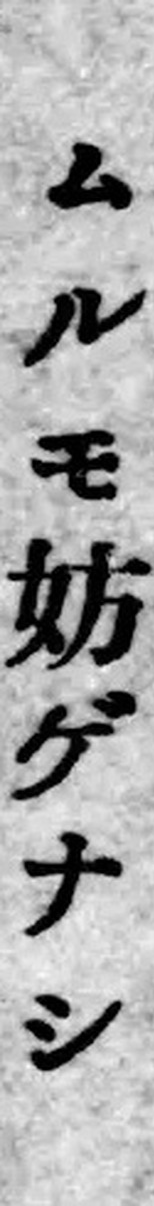ムルモ妨ゲナシ
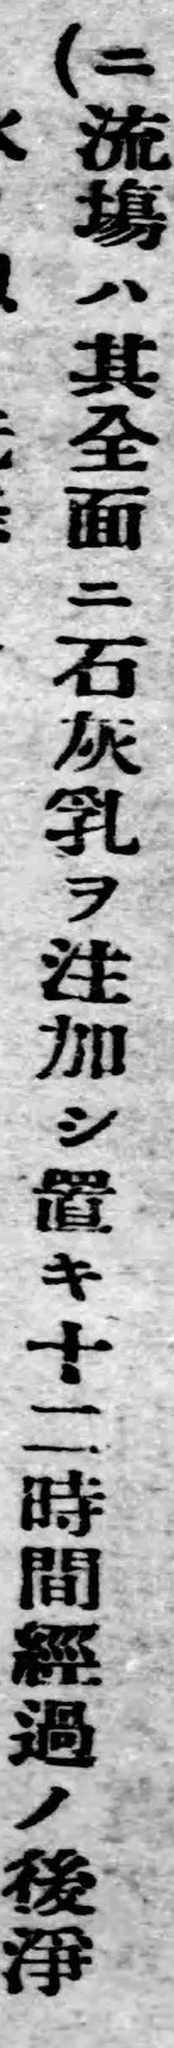(ニ)流塲ハ其全面ニ石灰乳注加シ置キ十二時間經過ノ後淨
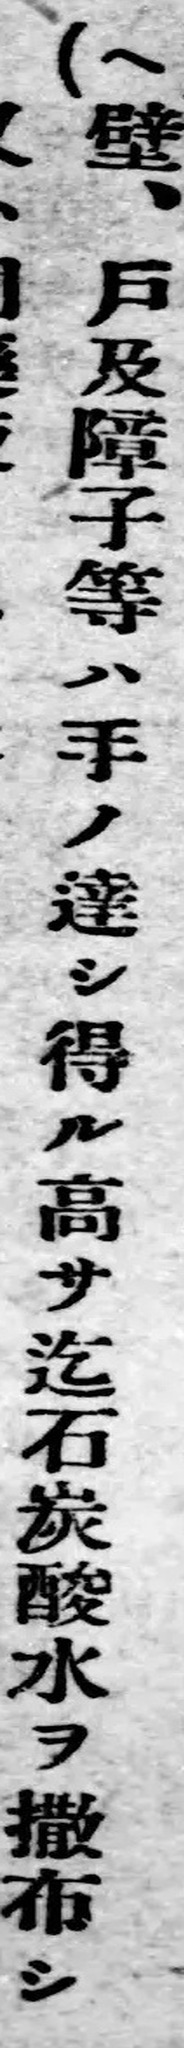(ヘ)壁、戸及障子等ハ手ノ達シ得ル高サ迄石炭酸水ヲ撒布シ
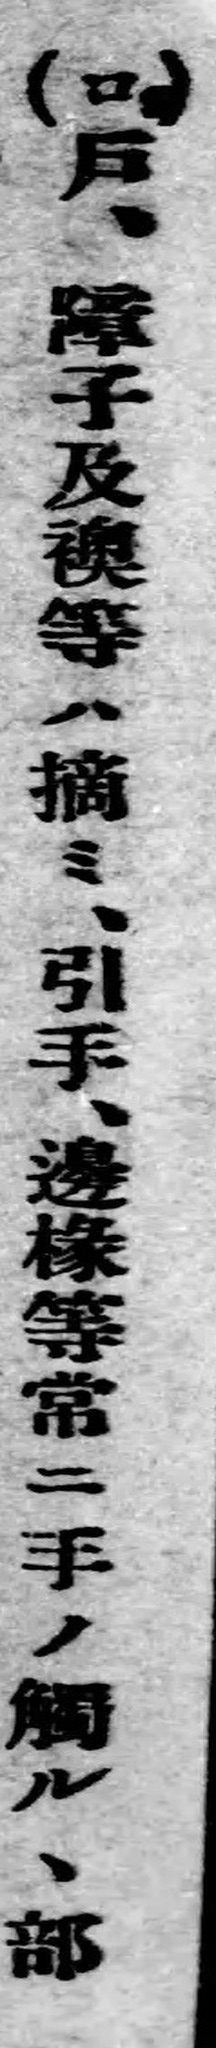(ロ)戸、障子及襖等ハ摘ミ、引手、辺椽等常ニ手ノ觸ルヽ部
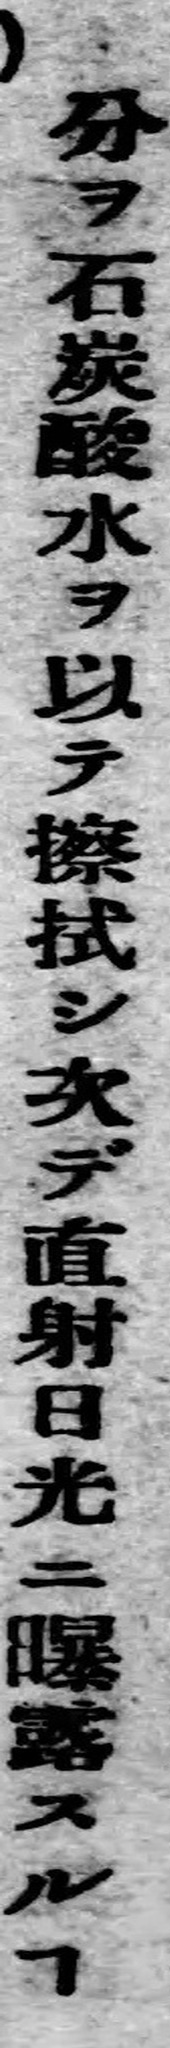分ヲ石炭酸水ヲ以テ擦拭シ次デ直射日光ニ曝露スルコト
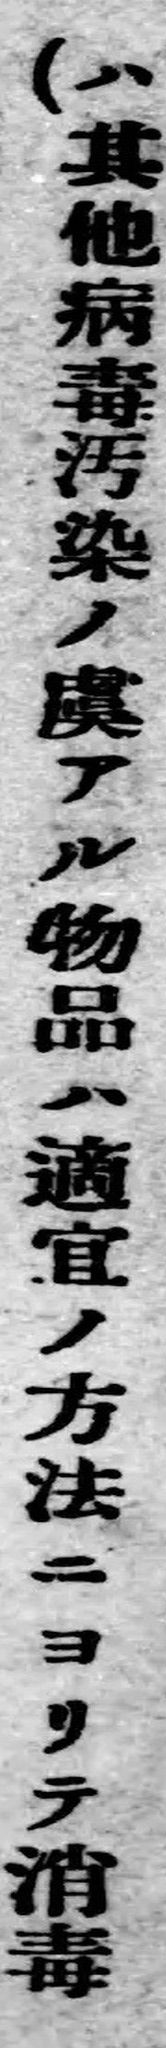(ハ)其他病毒汚染ノ虞アル物品ハ適宜ノ方法ニヨリテ消毒
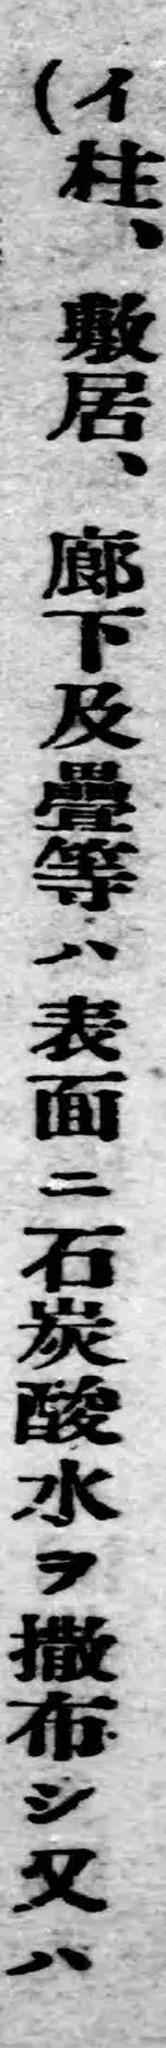(イ)柱、敷居、廊下及疊等ハ表面ニ石炭酸水ヲ撒布シ又ハ
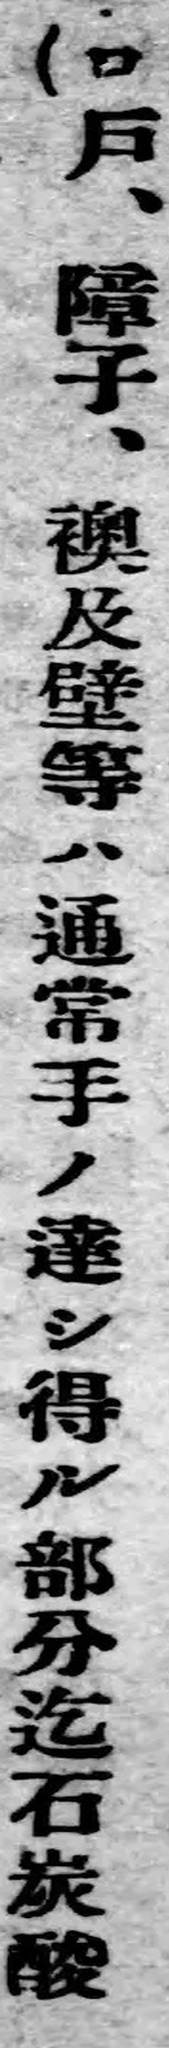(ロ)戸、障子、襖及壁等ハ通常手ノ達シ得ル部分迄石炭酸
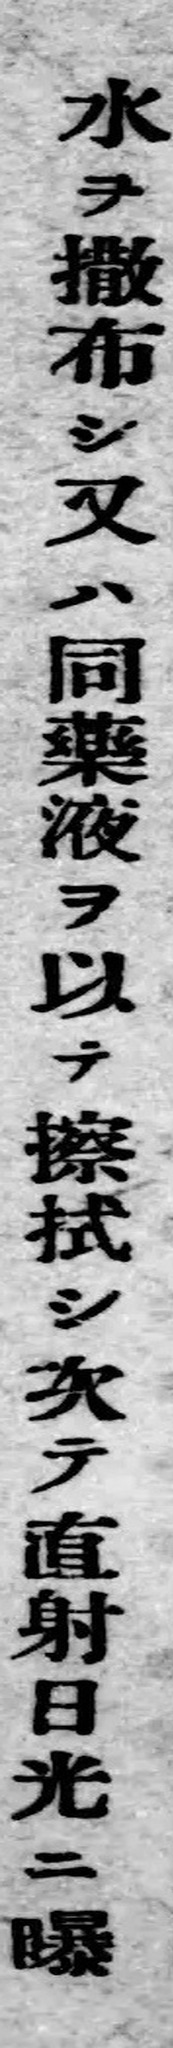水ヲ撒布シ又ハ同藥液ヲ以テ擦拭シ次テ直射日光ニ曝
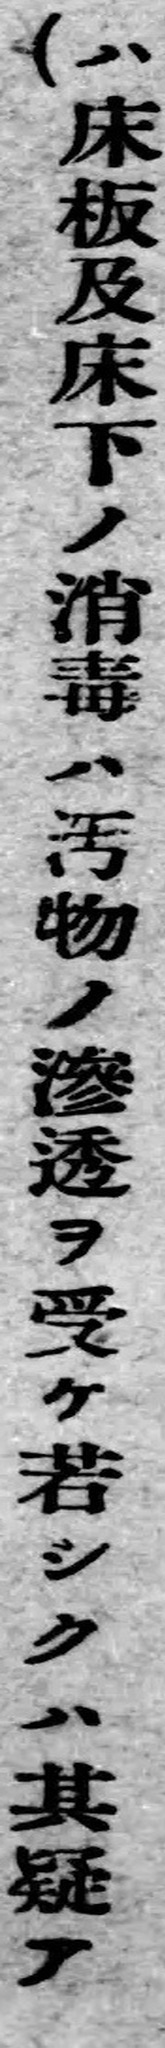(ハ)床板及床下ノ消毒ハ汚物ノ滲透ヲ受ケ若シクハ其疑ア

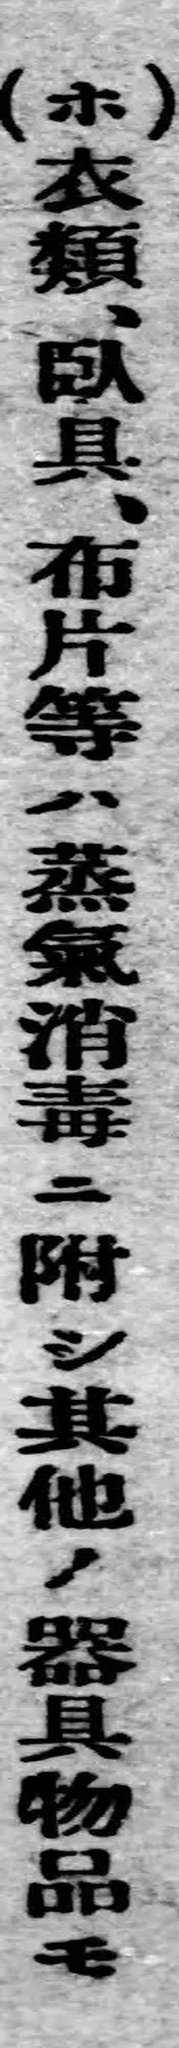(ホ)衣類、臥具、布片等ハ蒸氣消毒ニ附シ其他ノ器具物品モ
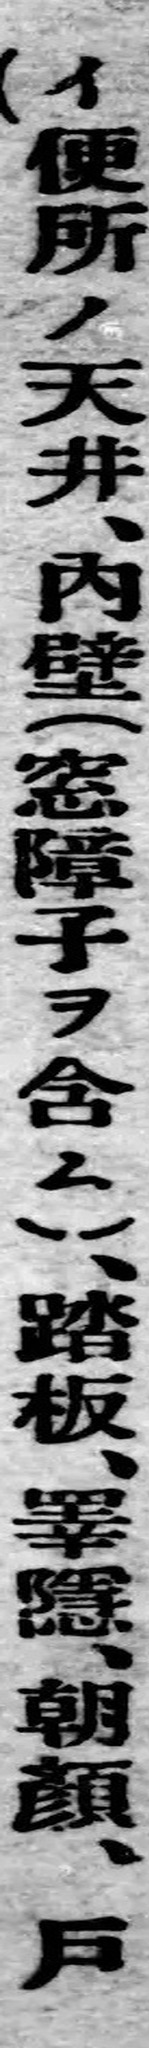(イ)便所ノ天井、内壁(窓障子ヲ含ム)、踏板、睪隱、朝顏、戸
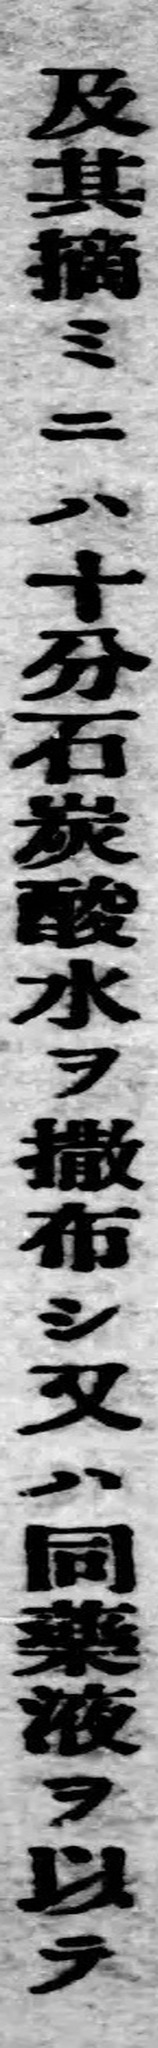及其摘ミニハ十分石炭酸水ヲ撒布シ又ハ同藥液ヲ以テ
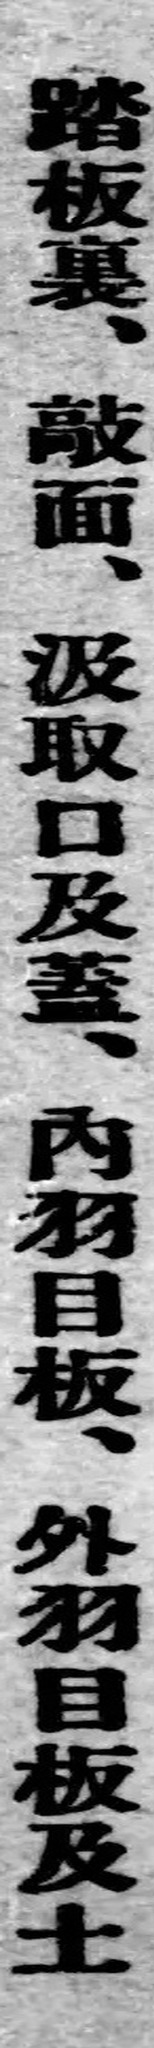踏板裏、敲面、汲取口及蓋、内羽目板、外羽目板及土
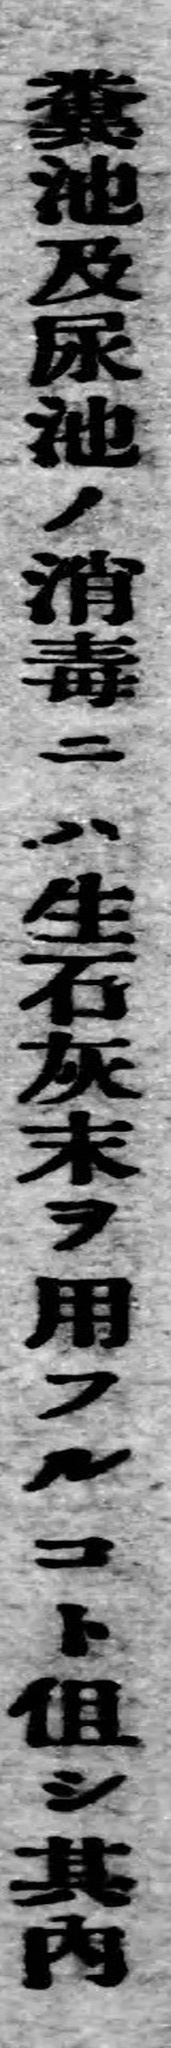糞池及尿池ノ消毒ニハ生石灰末ヲ用フルコト但シ其内
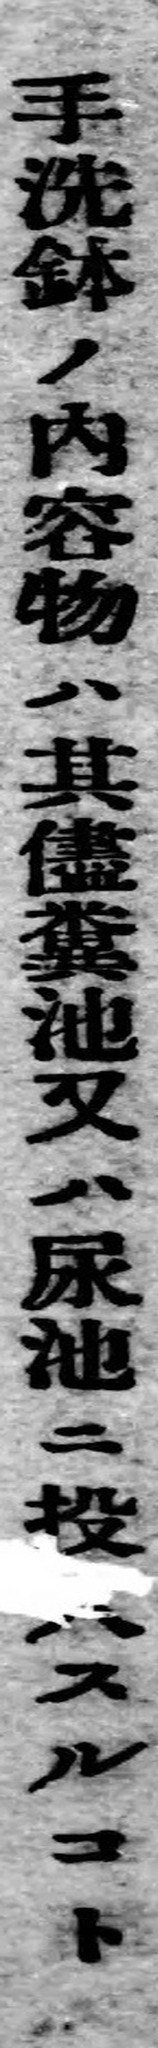手洗鉢ノ内容物ハ其儘糞池又ハ尿池ニ投入スルコト
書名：袖珍防疫必携
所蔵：国立国会図書館 National Diet Library, JAPAN
